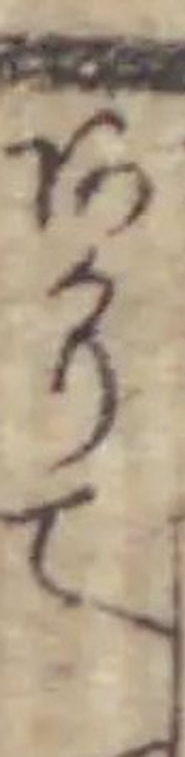あかりて
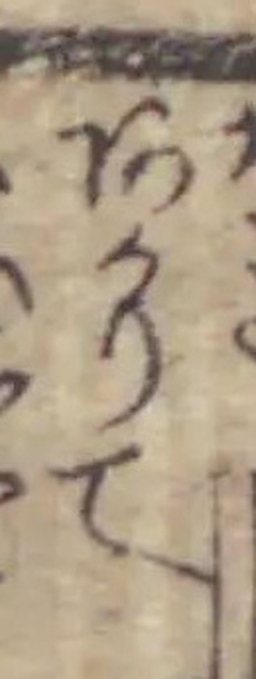あかりて
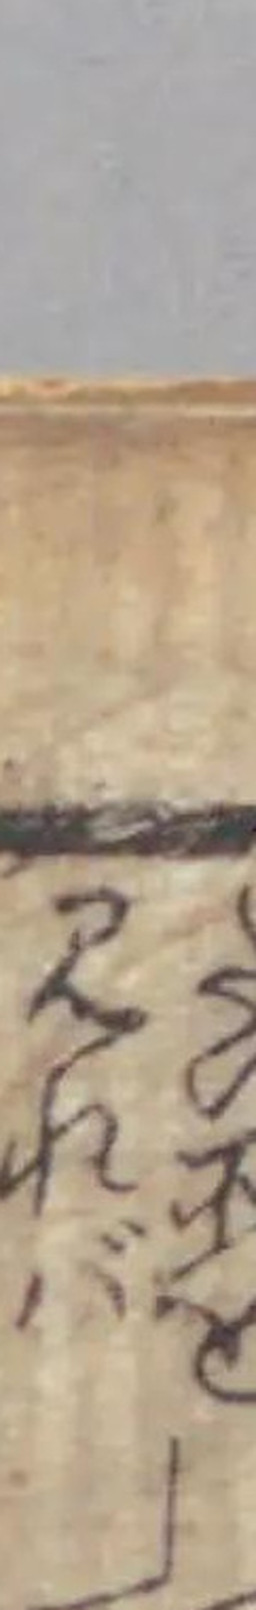見れば
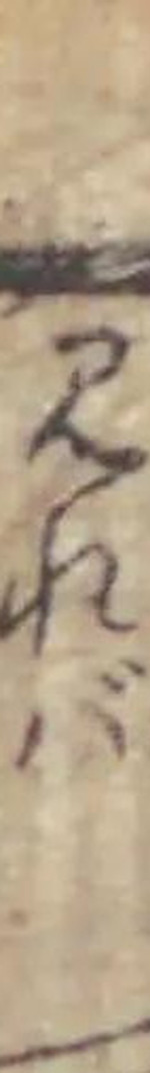見れば
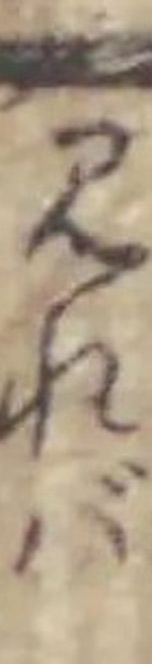見れば
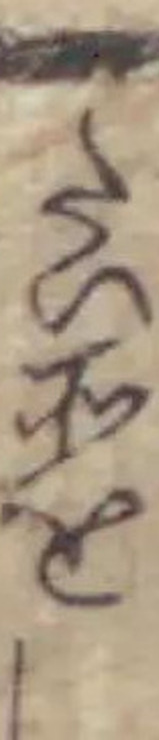たい所を
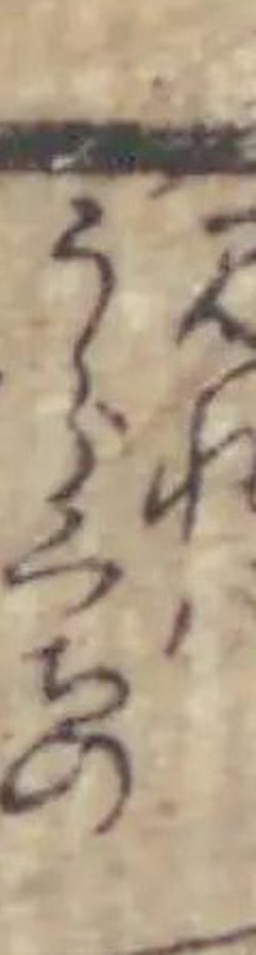うらくちの
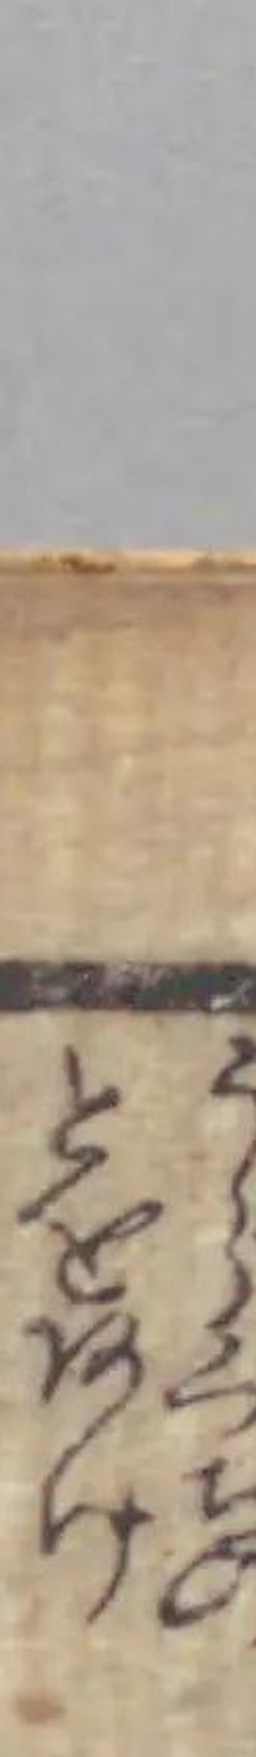とをあけ
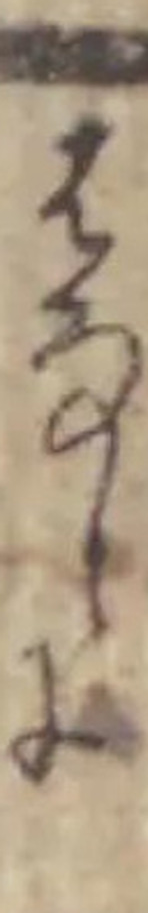はなしに
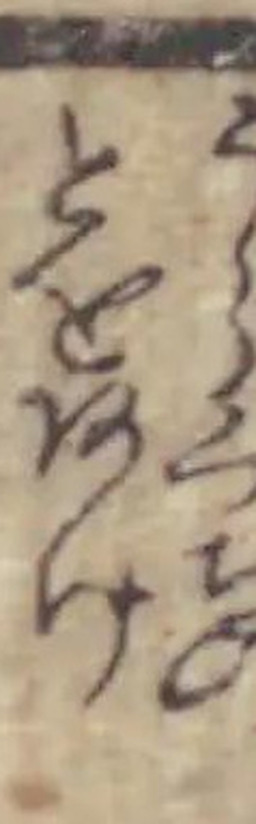とをあけ
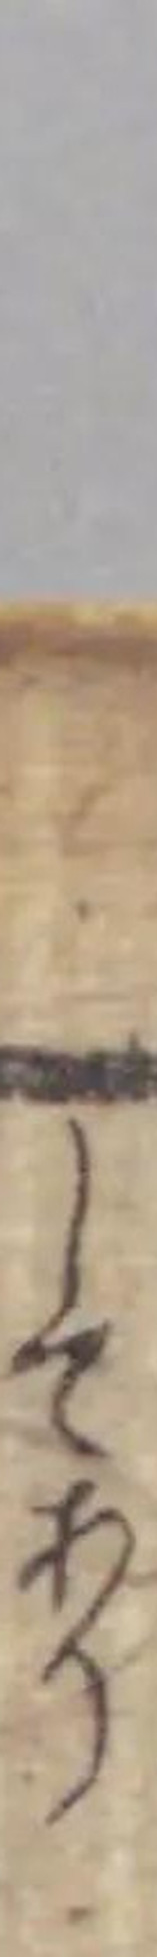してあり
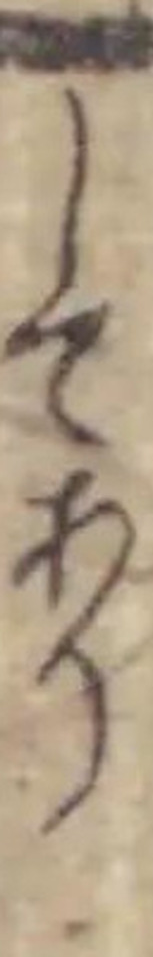してあり
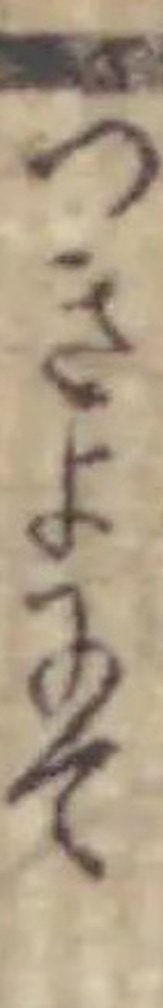つきよにて
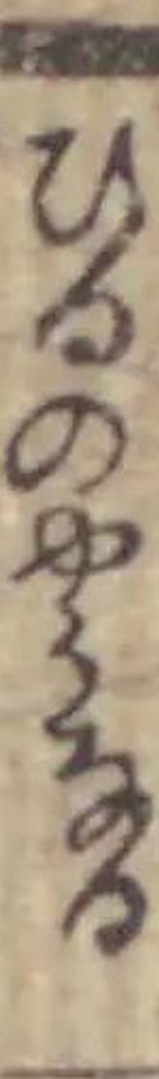ひるのやうなる
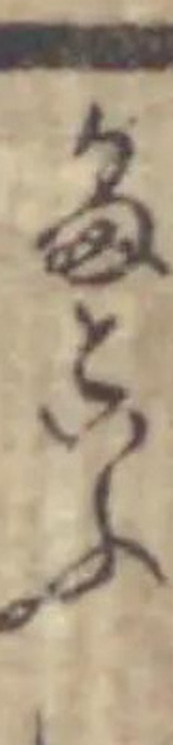かまといふ
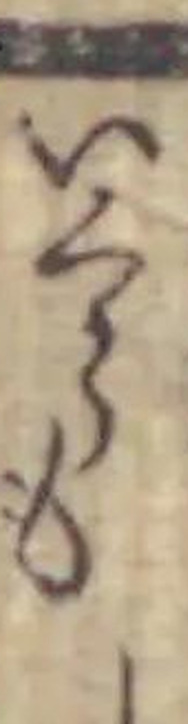いくらも
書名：間違月夜鍋 2巻
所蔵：国立国会図書館 National Diet Library, JAPAN
